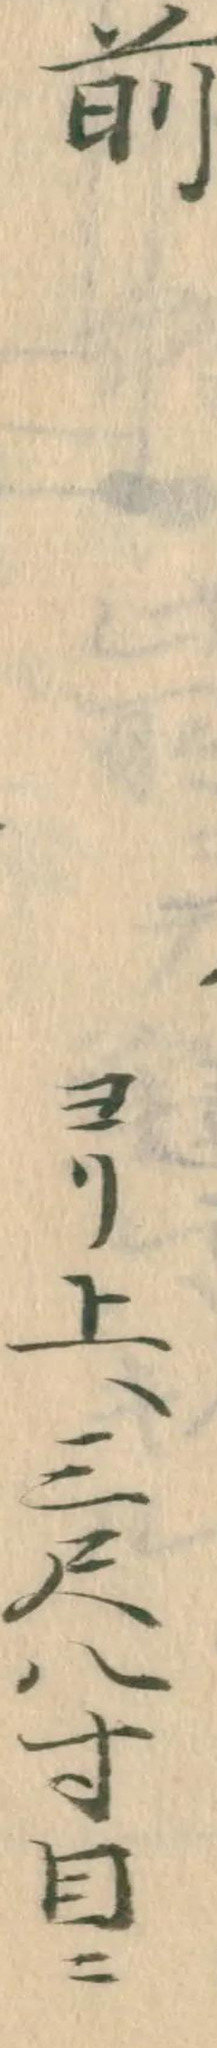前ヨリ上へ三尺八寸目ニ
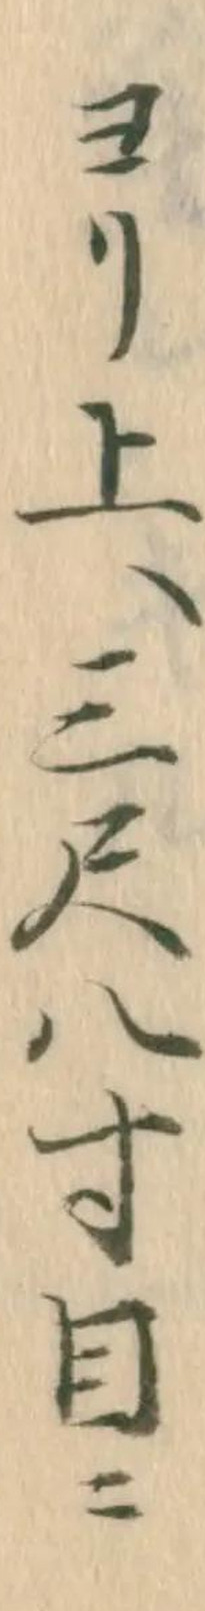前ヨリ上へ三尺八寸目ニ
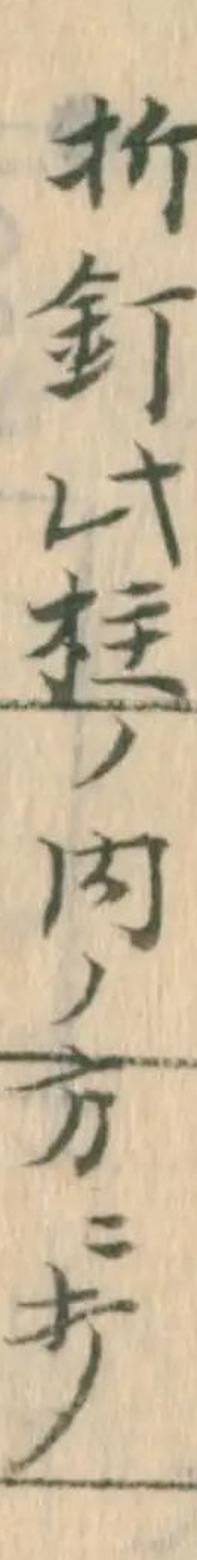折釘此柱ノ内ノ方ニ打
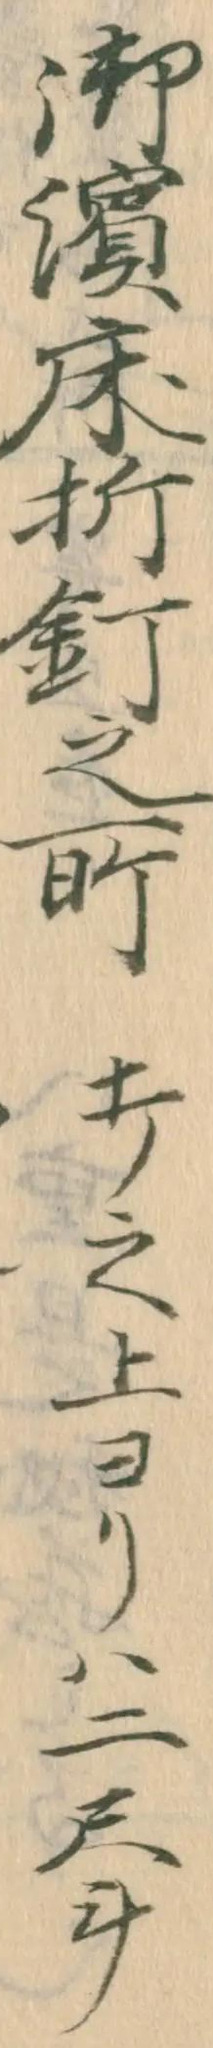御浜床打釘之所打之上ヨリハ二尺計
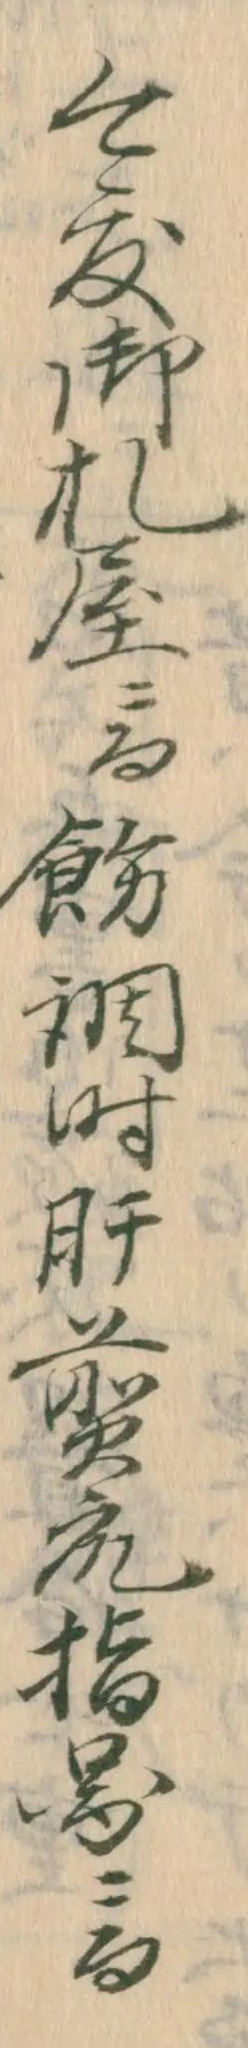今度御札屋ニ而錺調時肝煎衆指図ニ而
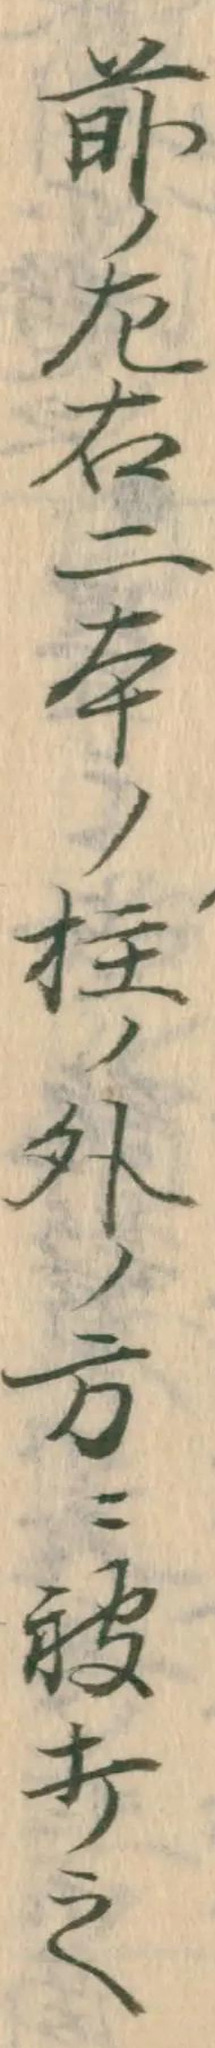前ノ左右二本ノ柱ノ外ノ方ニ被打之
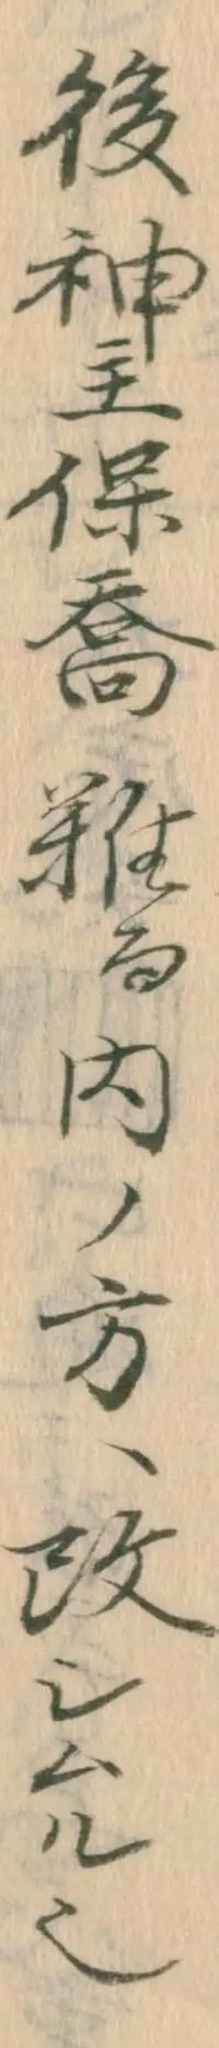後神主保喬難而内ノ方へ改シムル也
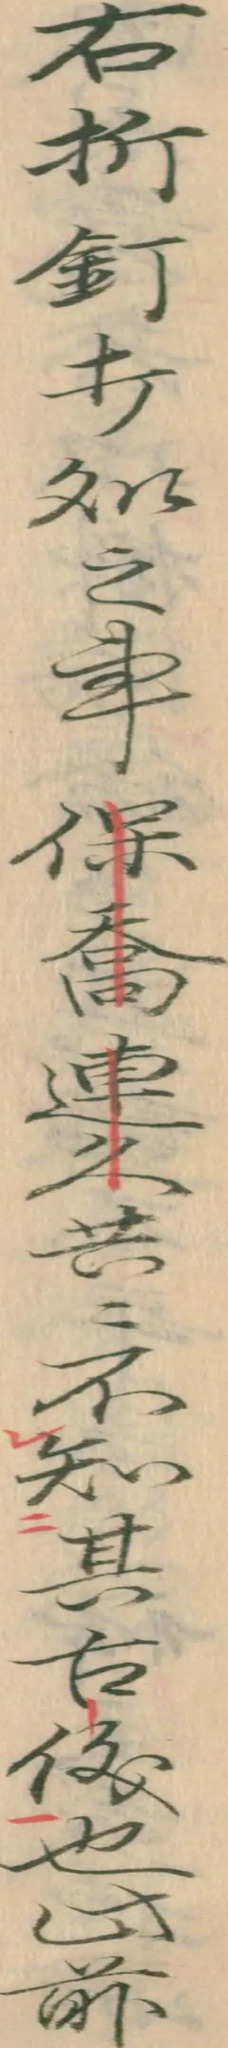右折釘打処之事保喬連久共ニ不知其古-儀也此前
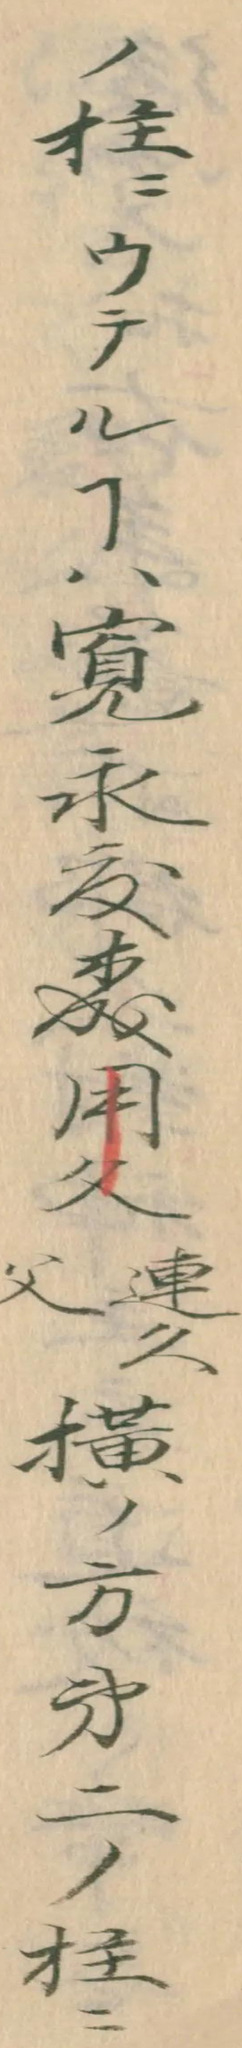ノ柱ニウテルコトハ寛永度森用久連久父横ノ方第二ノ柱ニ
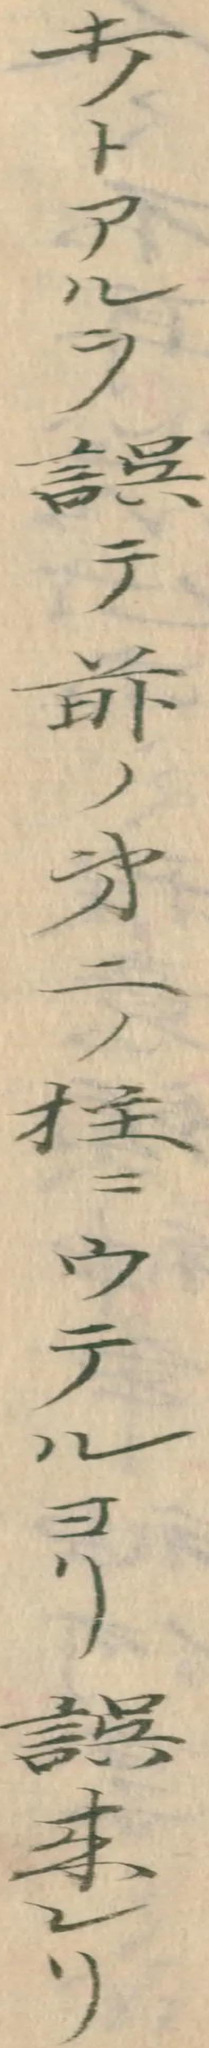打トアルヲ誤テ前ノ第二ノ柱ニウテルヨリ誤来レリ
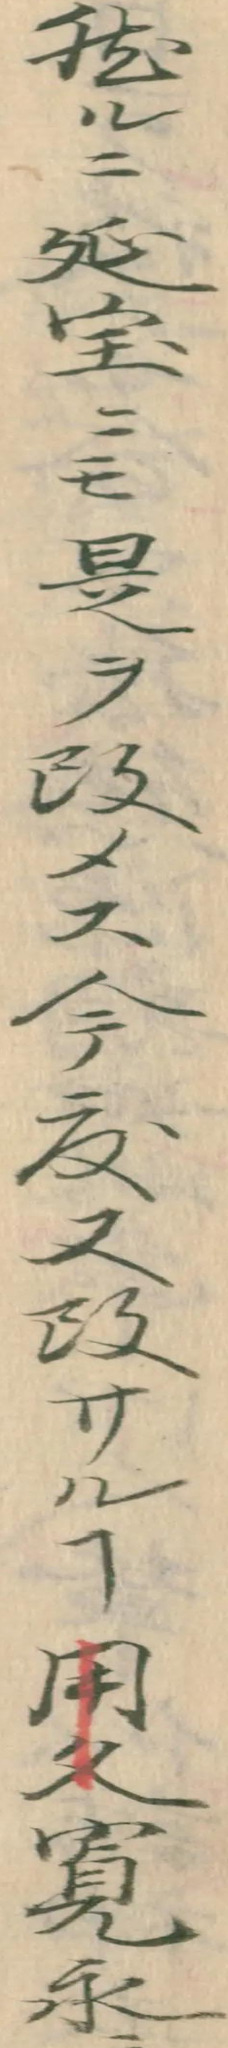然ルニ延宝ニモ是ヲ改メス今度又改サルコト用久寛永ニ
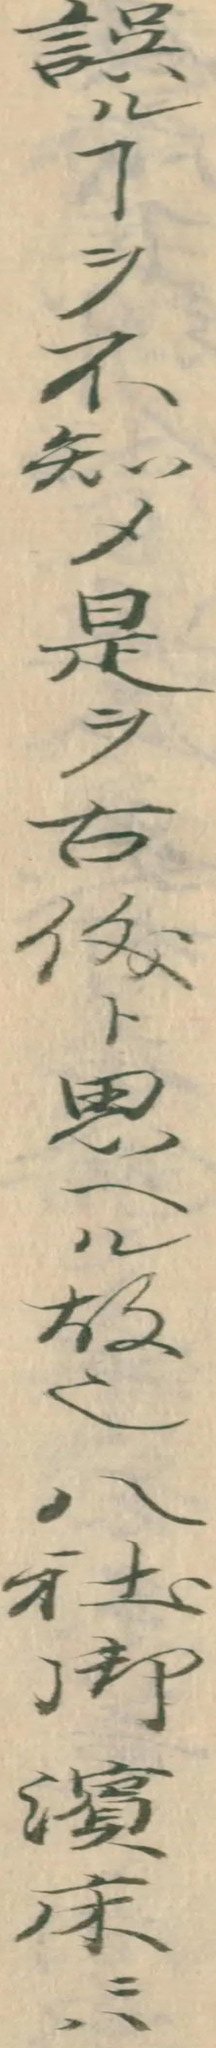誤ルコトヲ不知シテ是ヲ古儀ト思ヘル故也八社御浜床ニハ
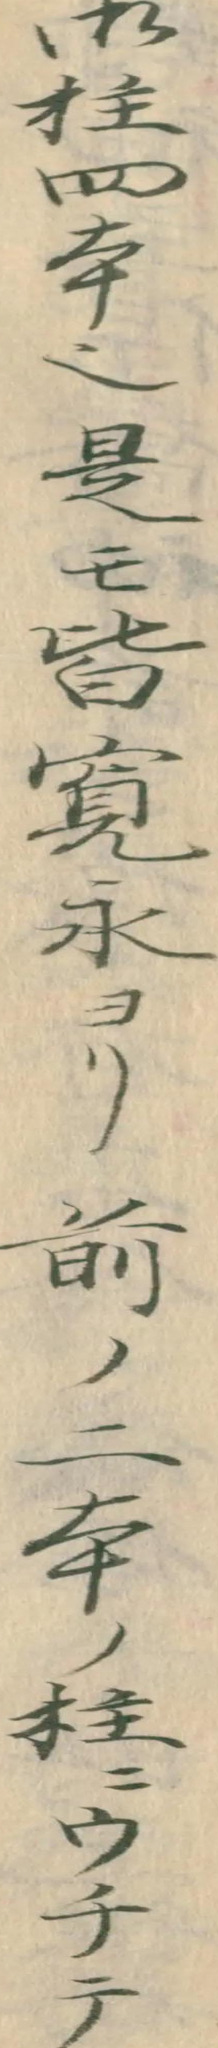御柱四本也是モ皆寛永ヨリ前ノ二本ノ柱ニウチテ
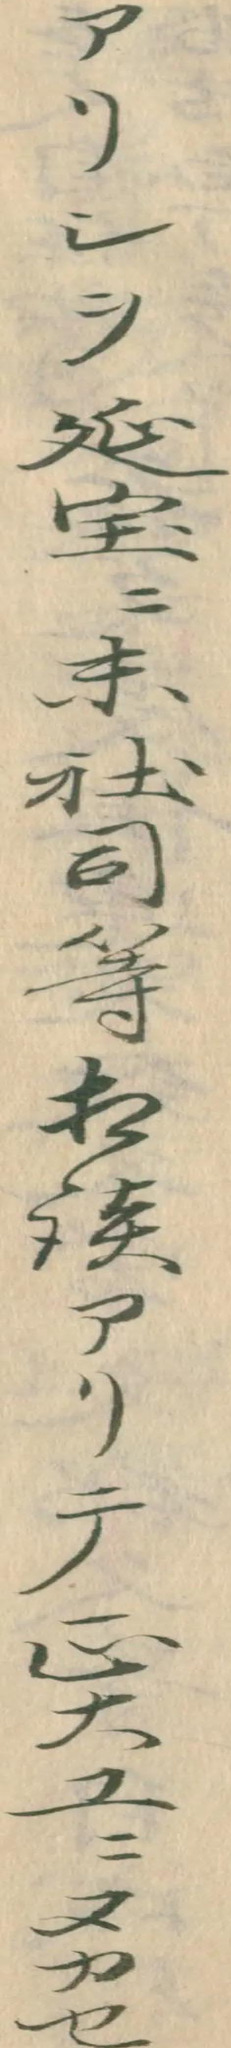アリシヲ延宝ニ末社司等相談アリテ正大工ニヌカセ
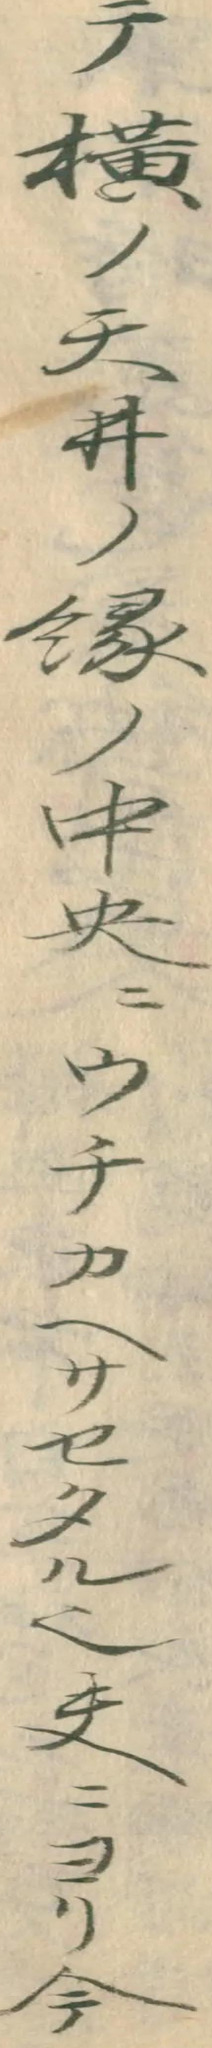テ横ノ天井ノ縁ノ中央ニウチカヘサセタル也夫ニヨリ今
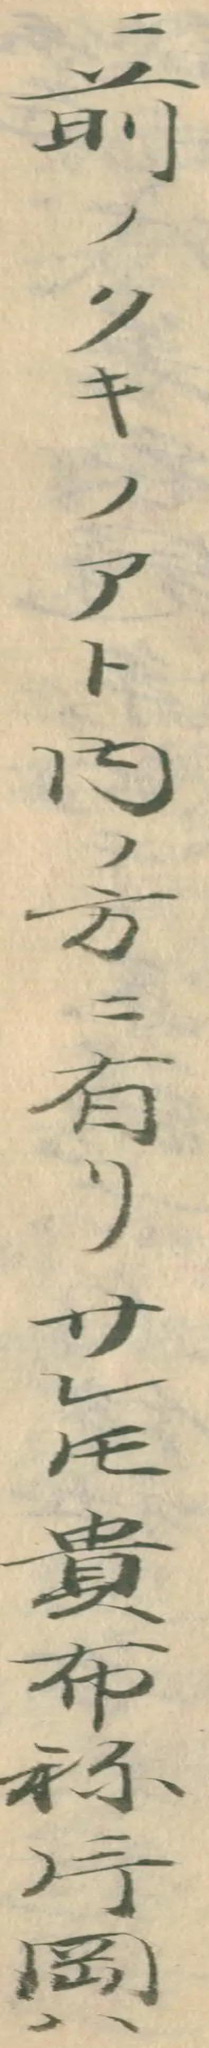ニ前ノクキノアト内ノ方ニ有リサレトモ貴布祢片岡ハ
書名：賀茂社記録. 第15冊
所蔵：国立国会図書館 National Diet Library, JAPAN
